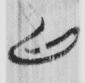㠯（以）
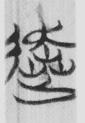{辶奔}
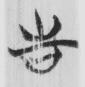告
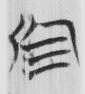於
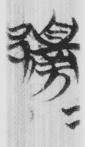臱阝=
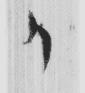人
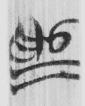爲
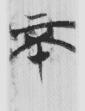不
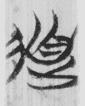道
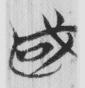或
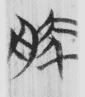航
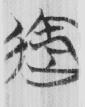御
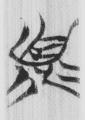寡
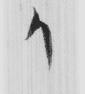人
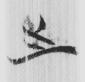之
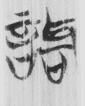詒
